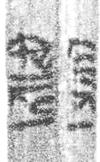箸（書）
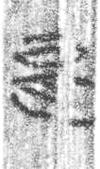是
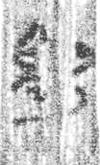胃（谓）
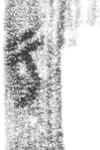宜
